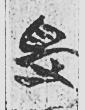{且又}
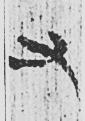又（有）
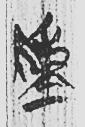陳
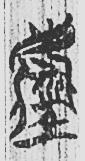{鹿巠}
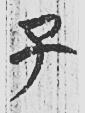子
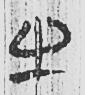牛
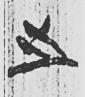之
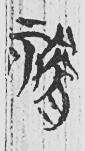禍
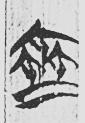齊
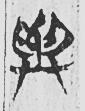與
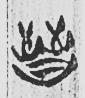晉
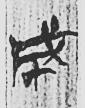成
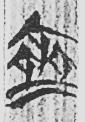齊
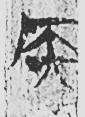侯
